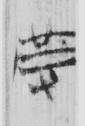皮
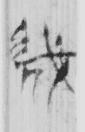幾
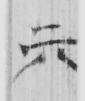亓
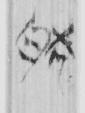肰
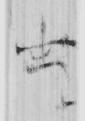才
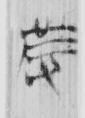皮
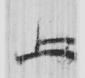上
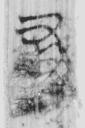有
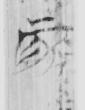所
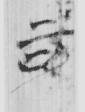可
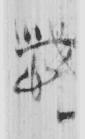慼
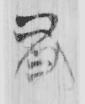有
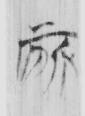所
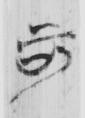可
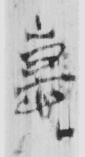𢝫
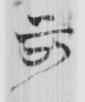可
